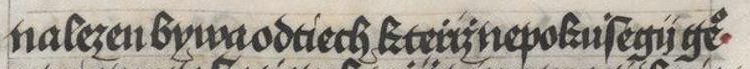nalezen bywa odtiech kteṙíż nepokuẛegij geo
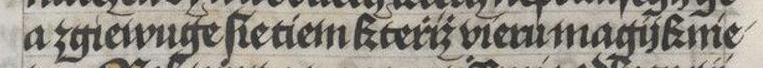a zgiewuge ſie tíem kteṙíż víeru magij kníe¬
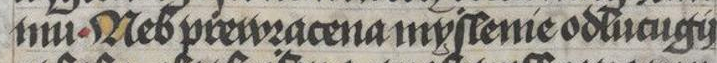mu. Neb pṙewracena myẛleníe odllucugíj
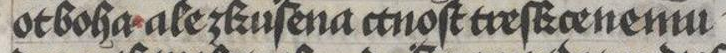ot boha.ale zkuẛena ctnoſt treſkce nemu¬
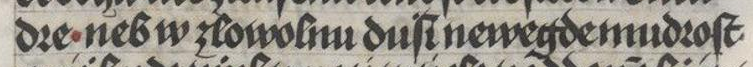dre.neb w zlowolnu duẛi newegde mudroſt.
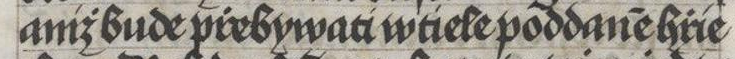aniż bude pṙebywati w tiele poddanē hṙíe¬
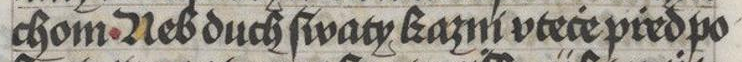chom.Neb duch ſwaty kazní vteċe pṙed po¬
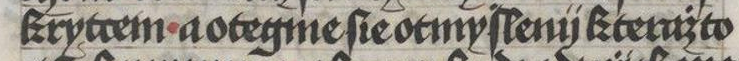krytcem.a otegme ſie otmyẛlenij kterażto
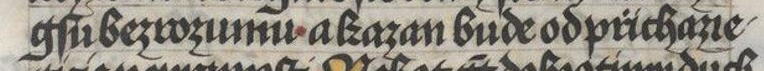gſu bezrozumu.a kazan bude odpṙíchazie¬
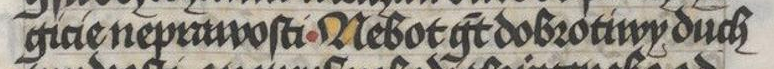gícíe neprawoſti.Nebot ḡt dobrotiwy duch
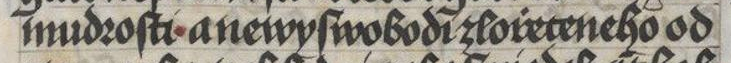mudroſtí.a newyſwobodí zloṙeceneho od
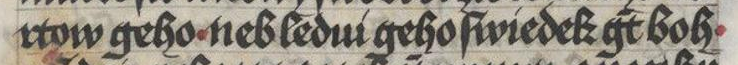rtow geho.neb leduí geho ſwíedek ḡt boh.
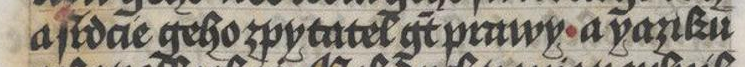a ſrdcíe geho zpytatel ḡt prawy.a yaziku
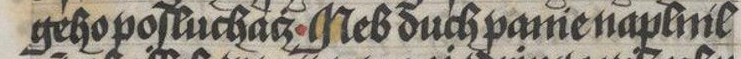geho poſluchacż.Neb duch panie naplnil
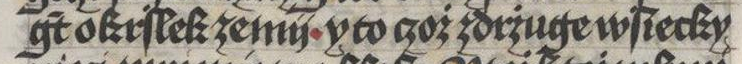ḡt okrẛlek zemíj.y to czoż zdrżuge wẛiecky
